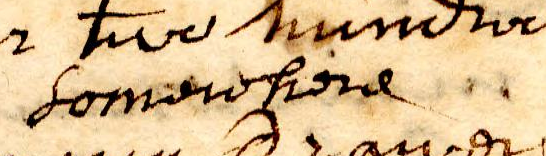somewhere
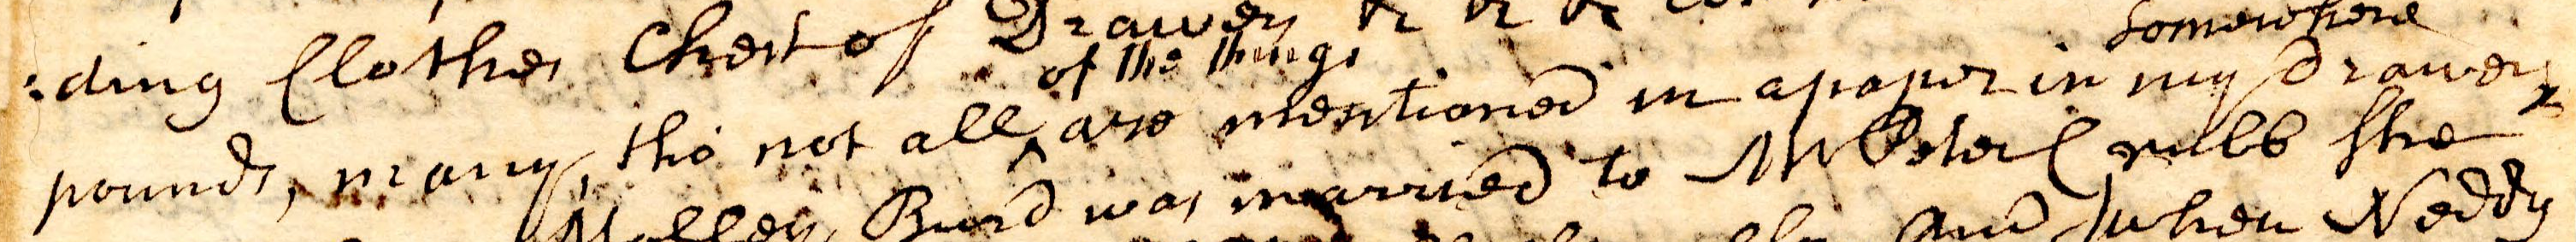pounds, many tho' not all ^ are mentioned in a paper in my drawer
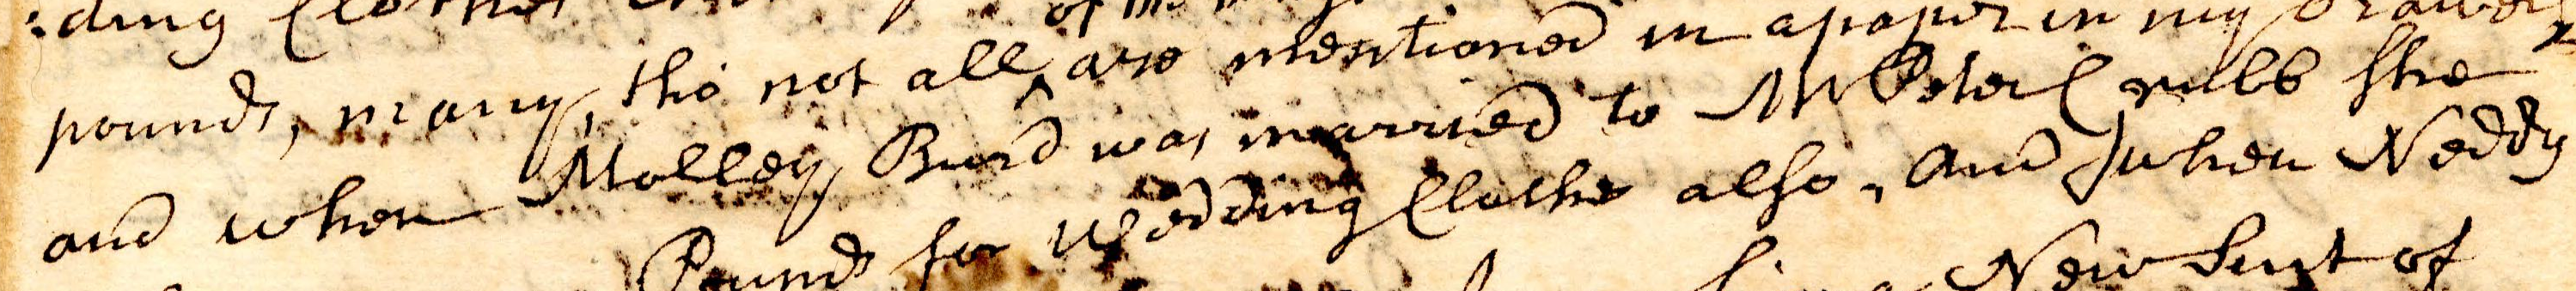and when Molley Burd was married to M^r Peter Crabb she
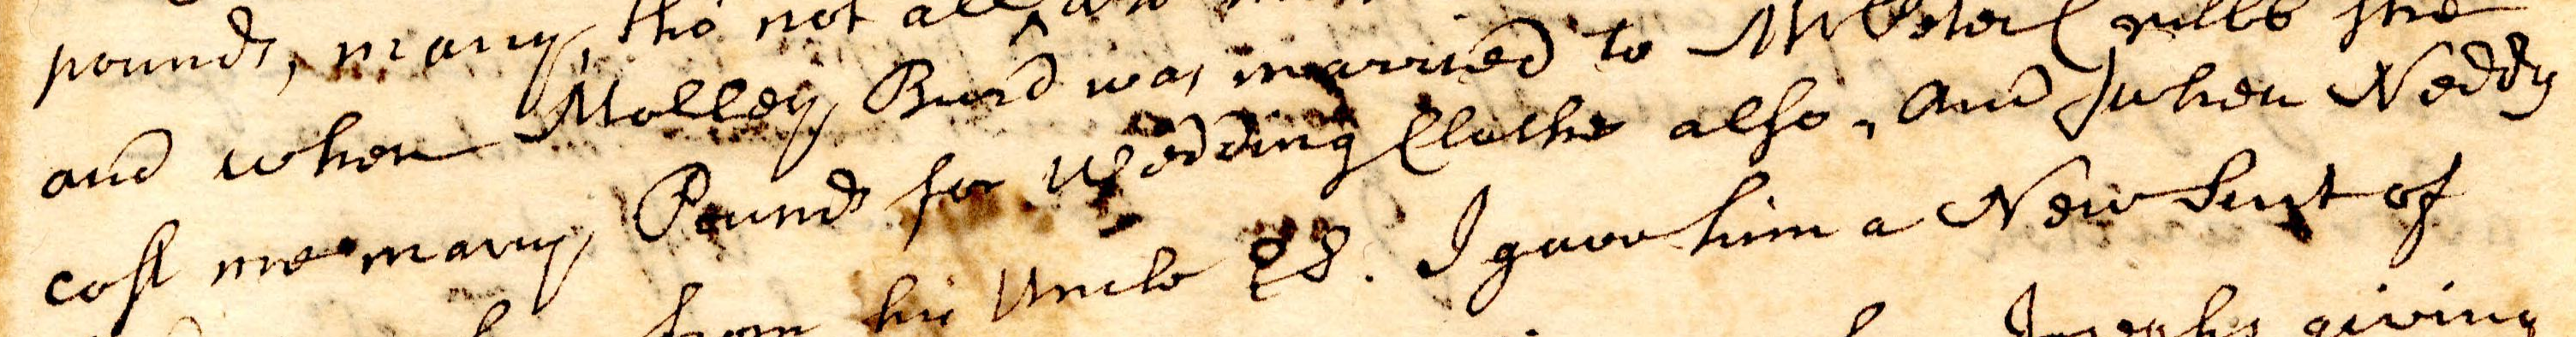cost me many Pounds for Wedding Cloths also, and when Neddy
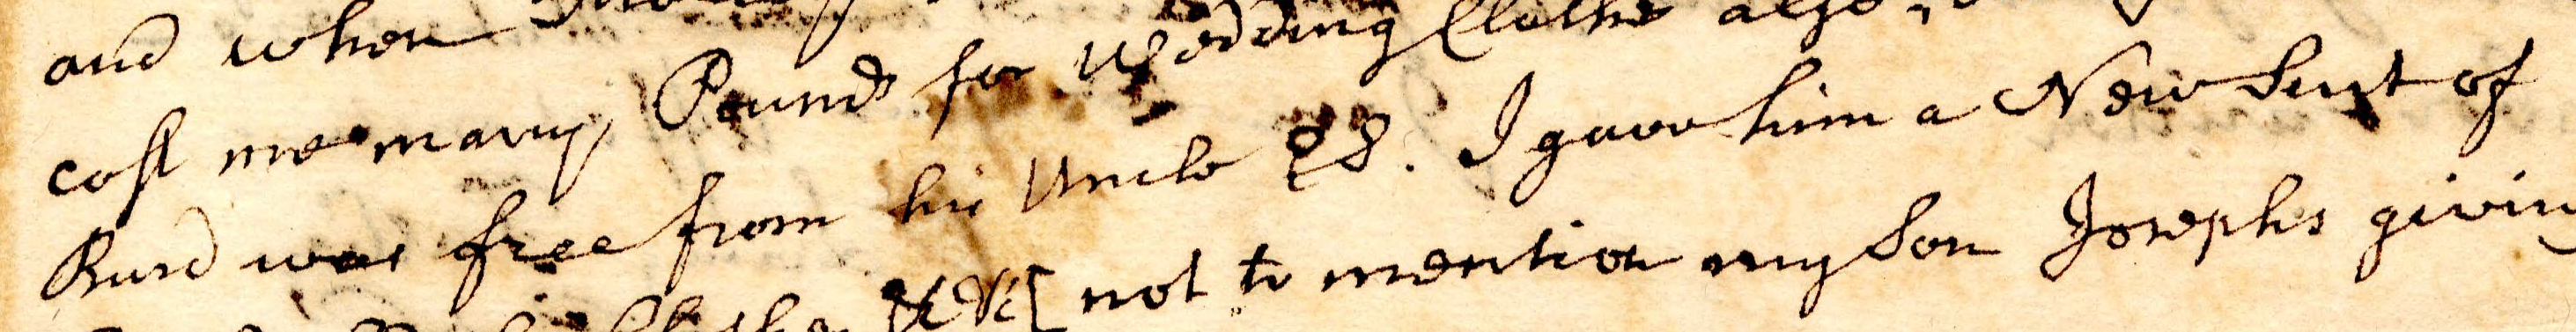Burd was free from his Uncle E.S. I gave him a New Set of
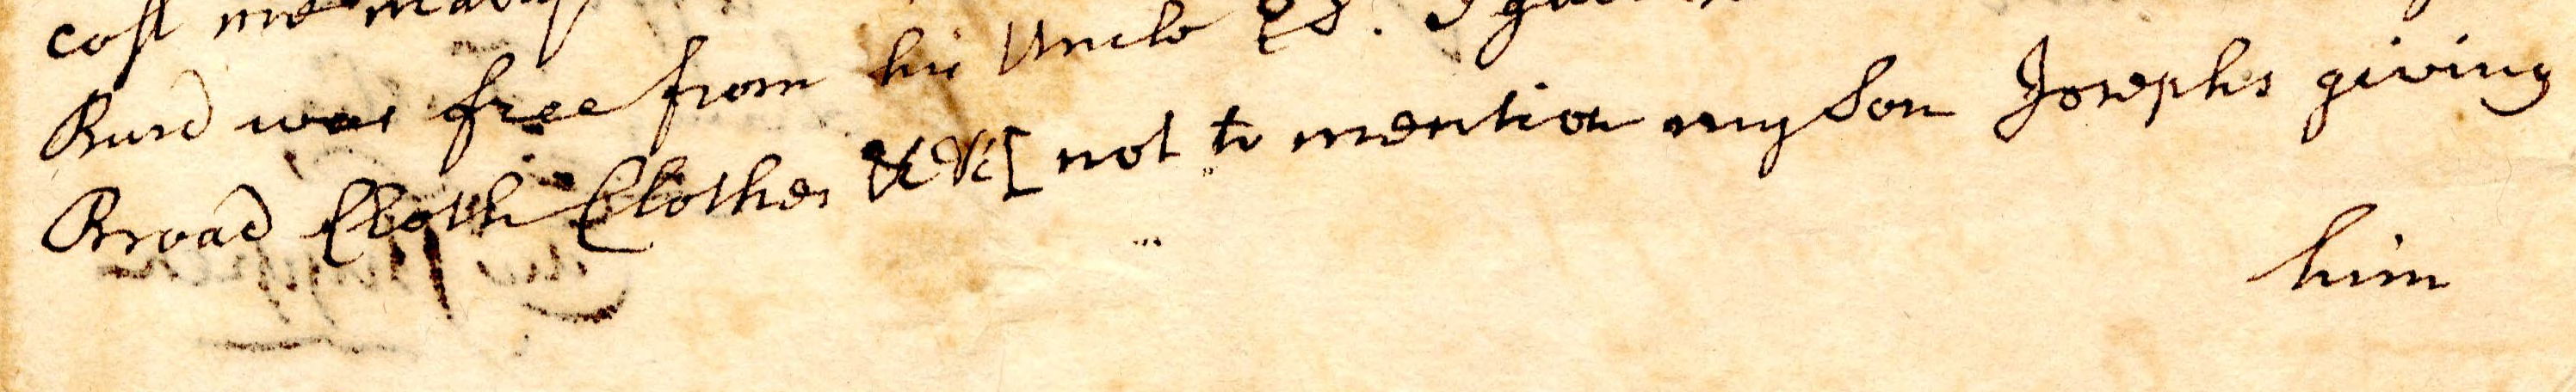Broad Cloth Clothes &c &c [not to mention my Son Josephs giving
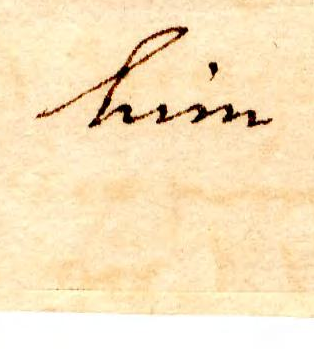him
